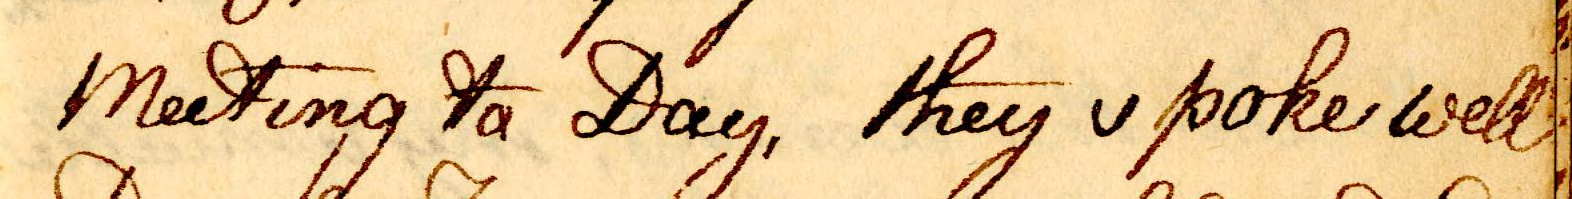Meeting to Day, they spoke well
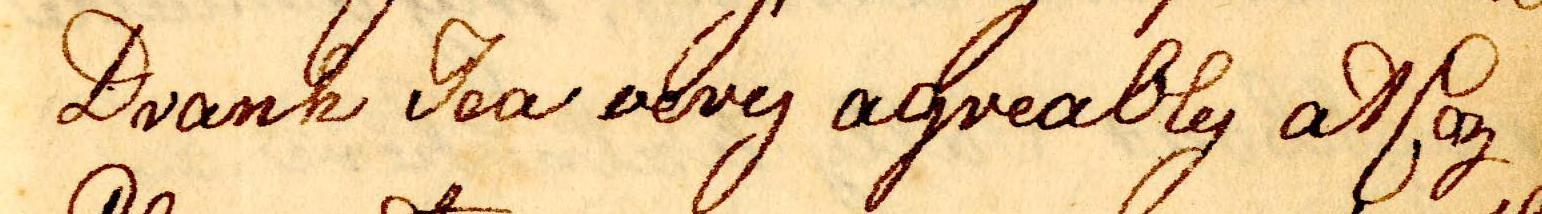Drank Tea very agreably at Coz
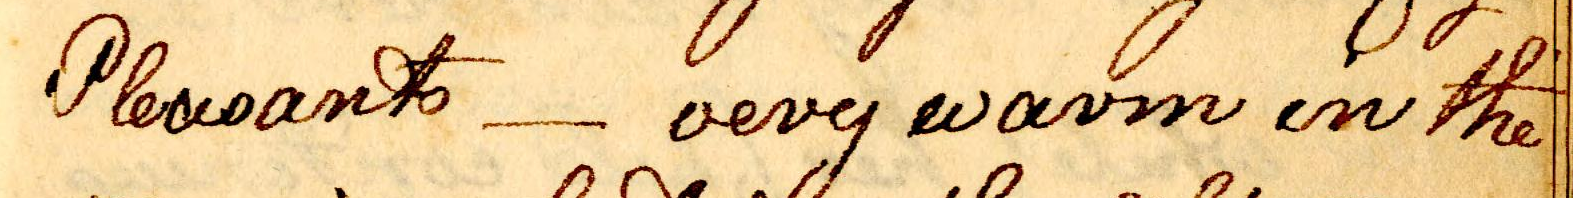Pleasants- very warm in the
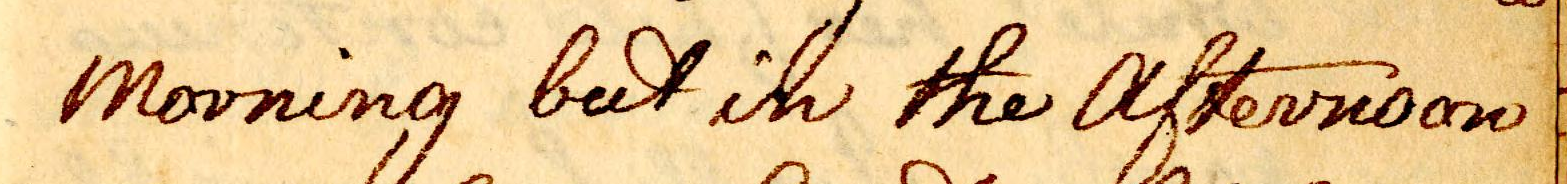Morning but in the Afternoon
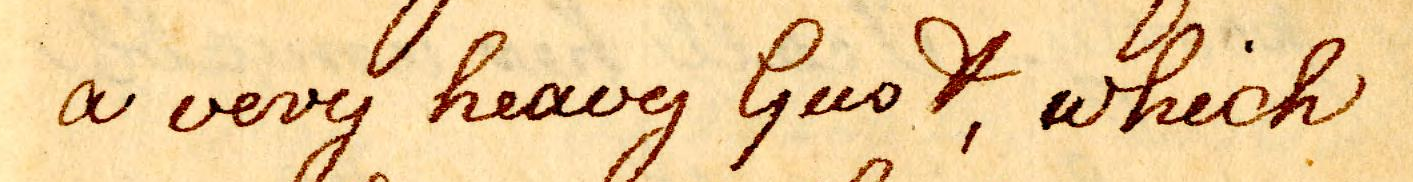a very heavy Gust, which
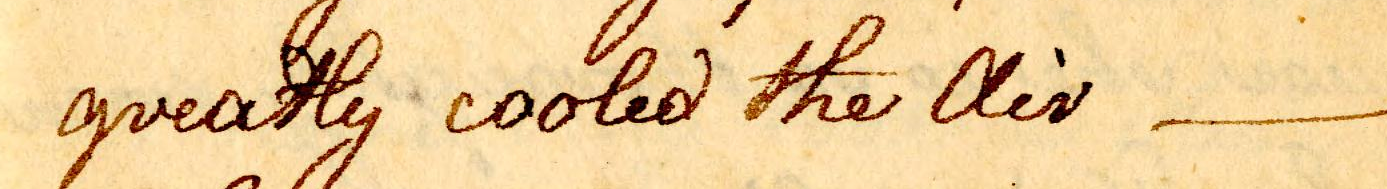greatly cooled the Air
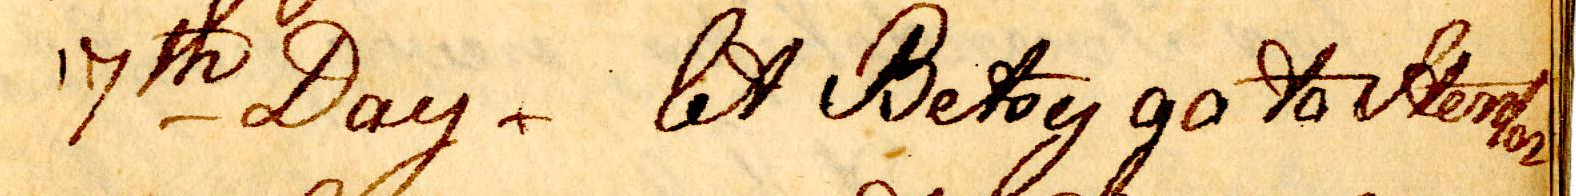7^th Day- let Betsy go to Stenton
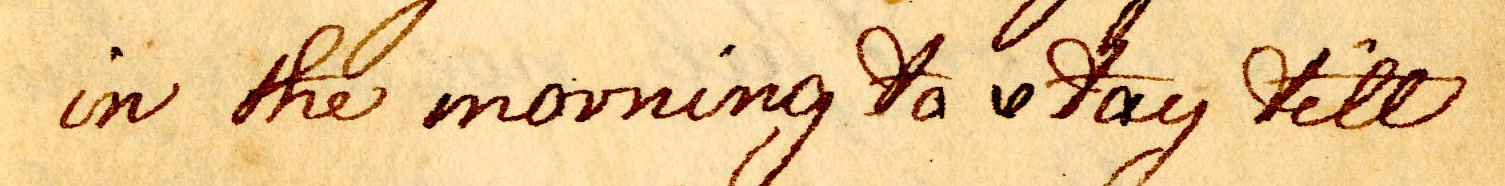in the morning to stay till
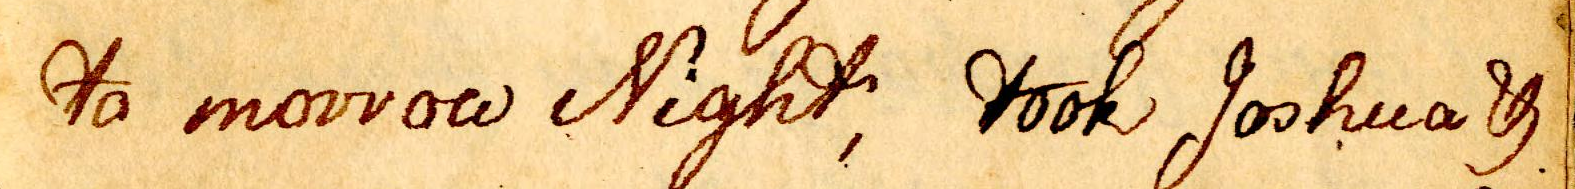to morrow Night, took Joshua &
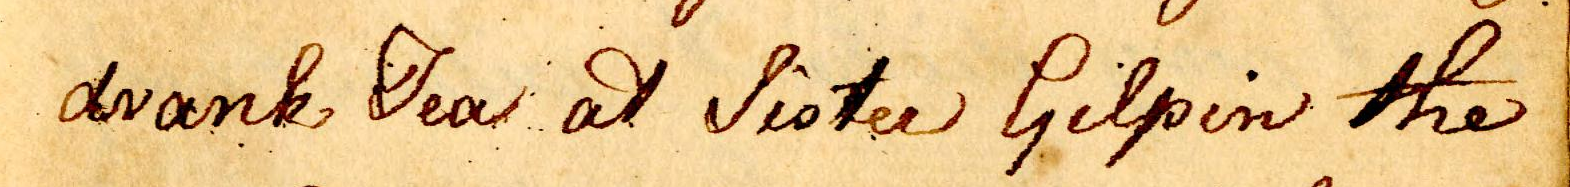drank Tea at Sister Gilpin the
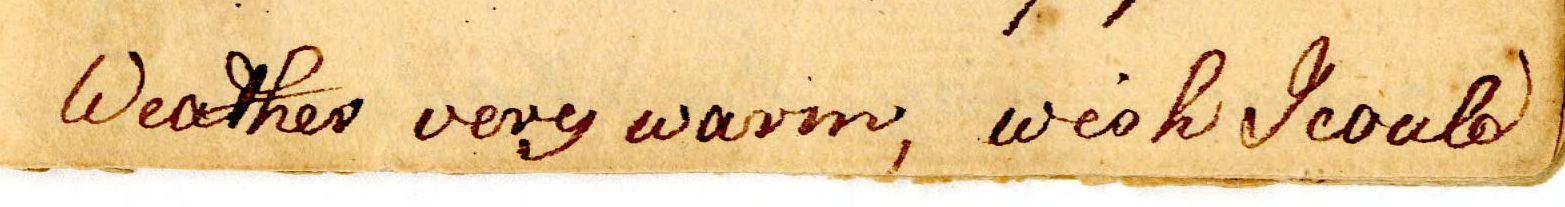Weather very warm, wish I could
